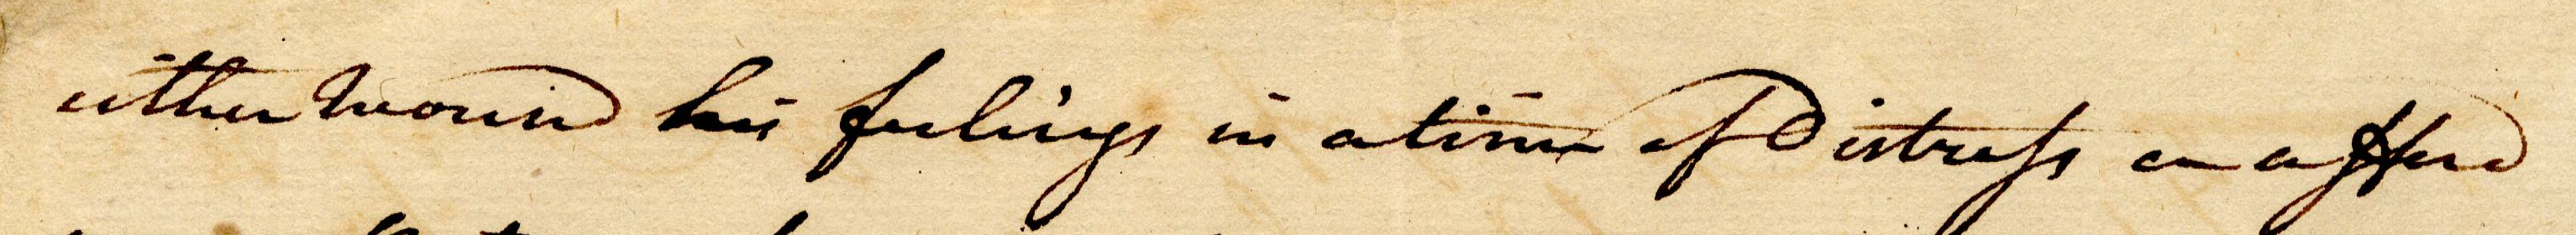either wound his feelings is a time of distress or afford
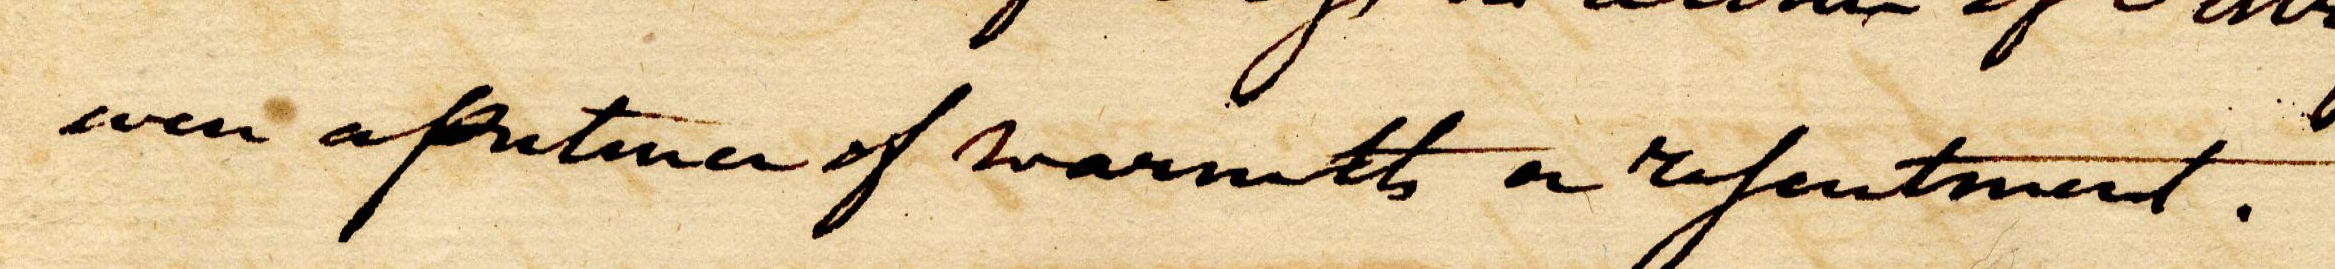even a pretense of warmth as resentment.
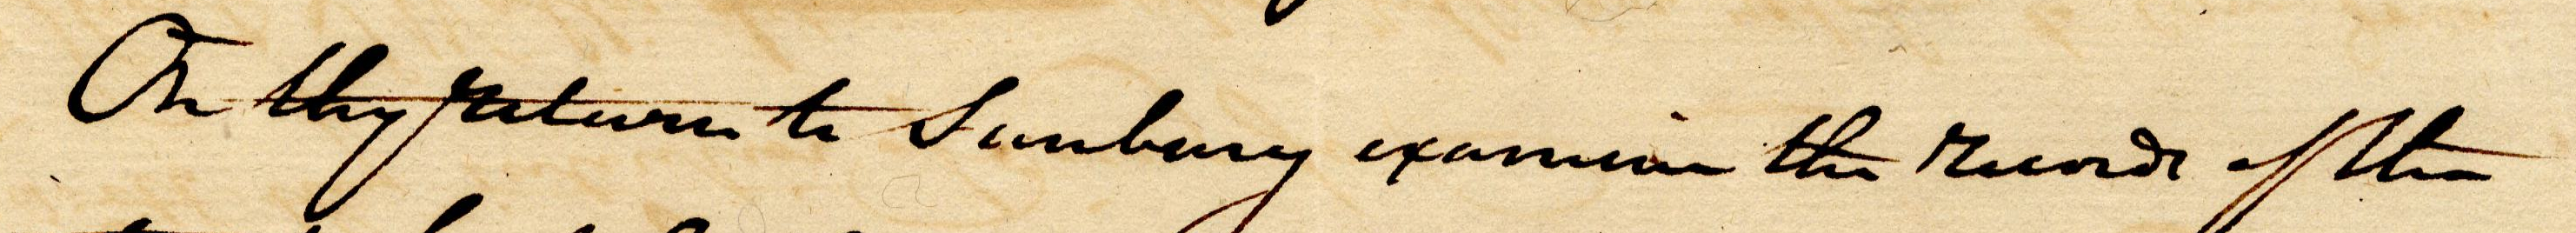Oh thy return to Sunbury examine the records of the
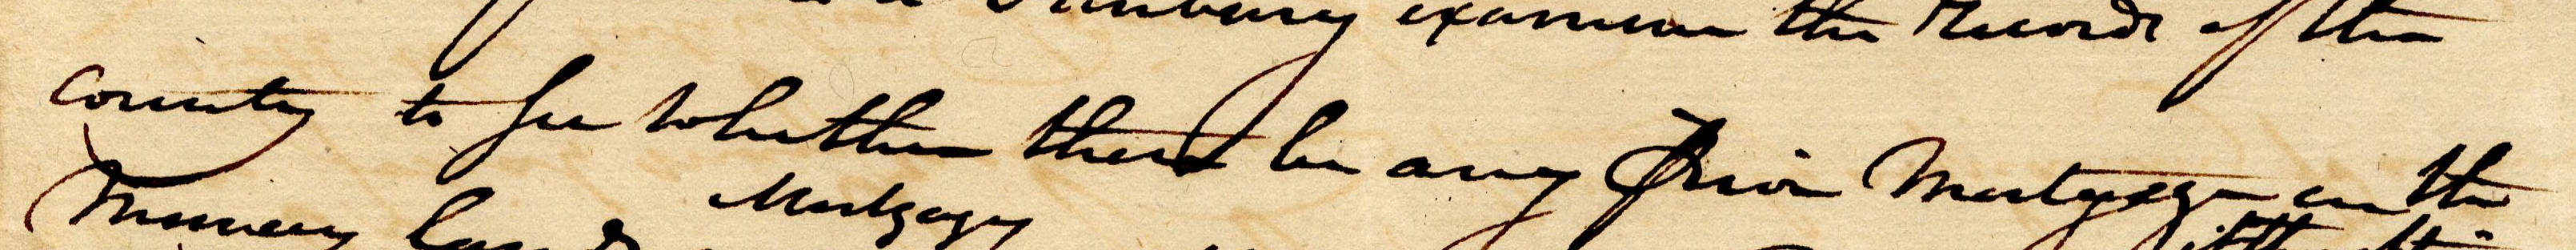county to see whether there be any prior mortgage on the
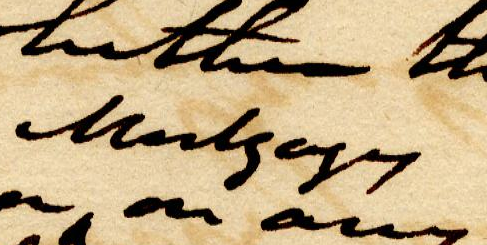mortgages
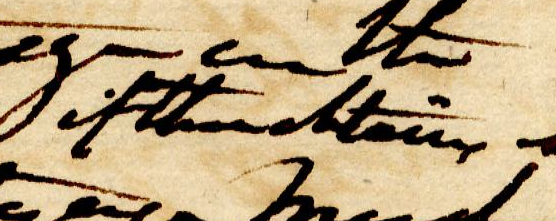if thee obtains
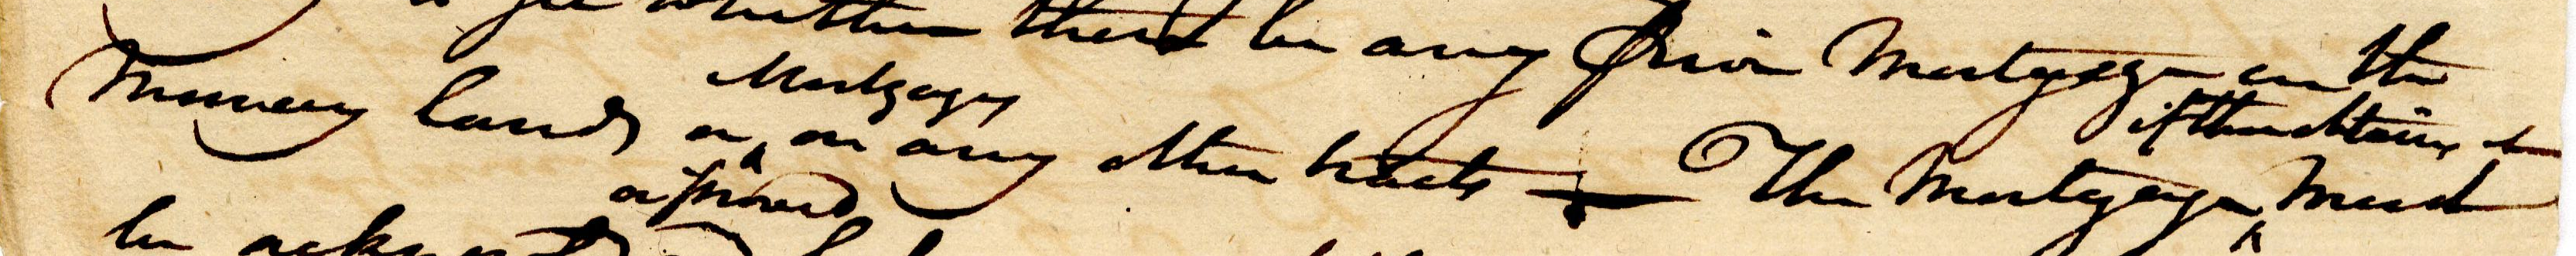muncey lands or on any other- The mortgage ^ must
